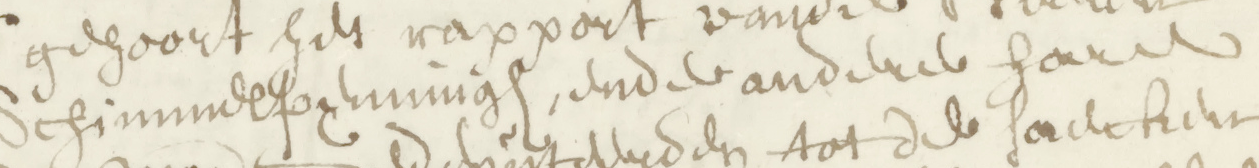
Schimmelpenningh, ende andere hare
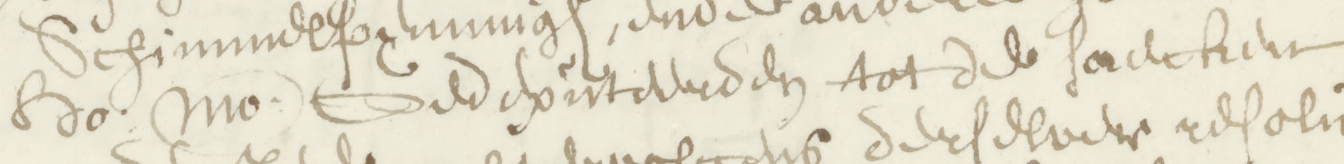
Ho:Mo: Gedeputeerden tot de saecken
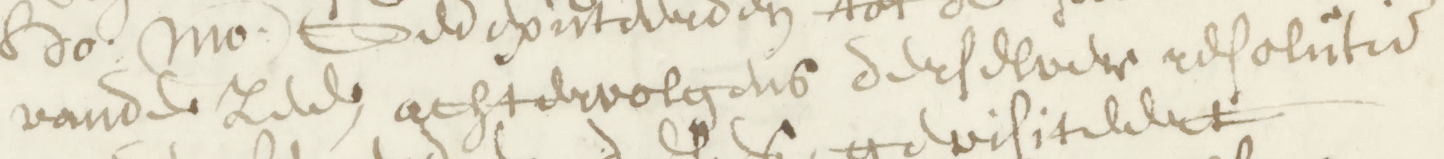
vande zee, achtervolgens derselver resolutie
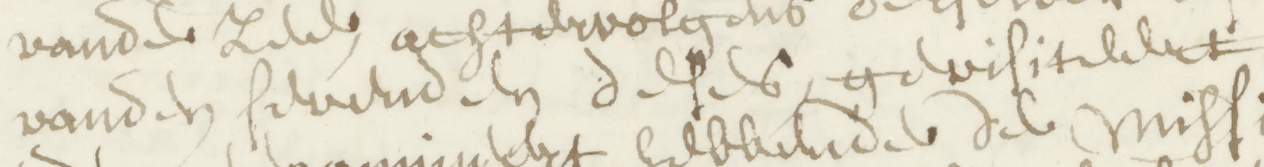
vanden sevenden deses, gevisiteert
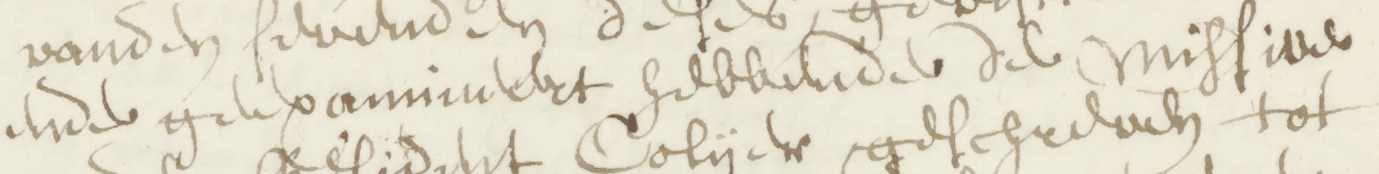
ende geexamineert hebbende de missive
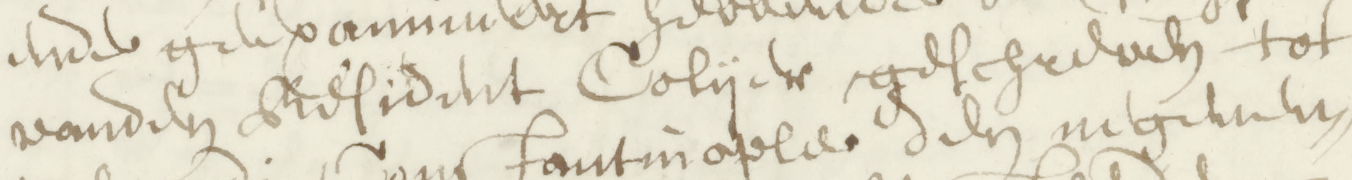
vanden Resident Colijer, geschreven tot
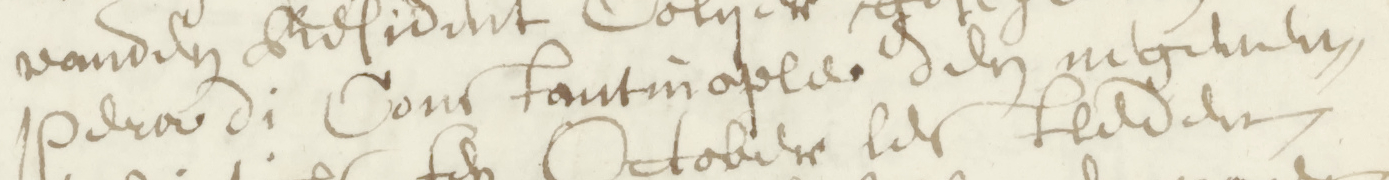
Pera di Constantinople den negenen„,
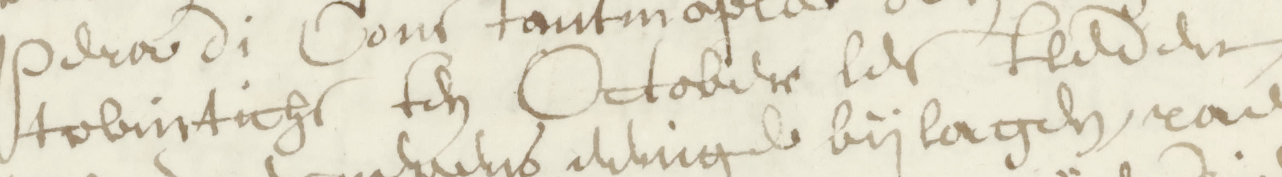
twintichsten October lestleden
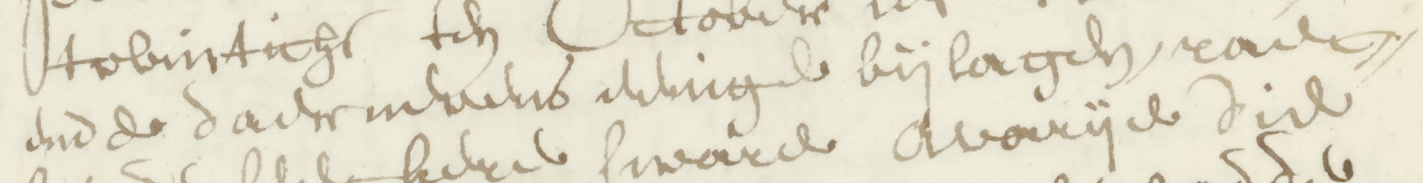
ende daernevens eenige bijlagen, raec„
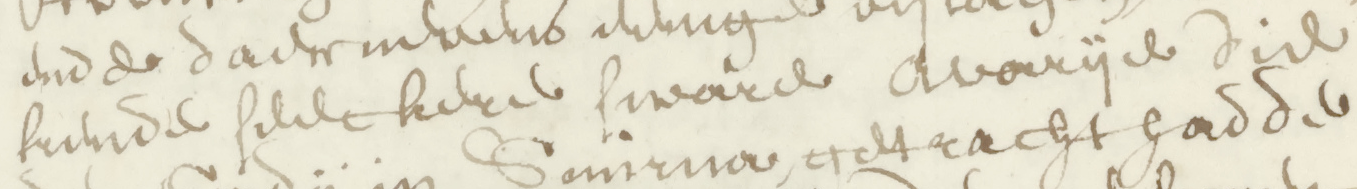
kende seeckere sware avarije die
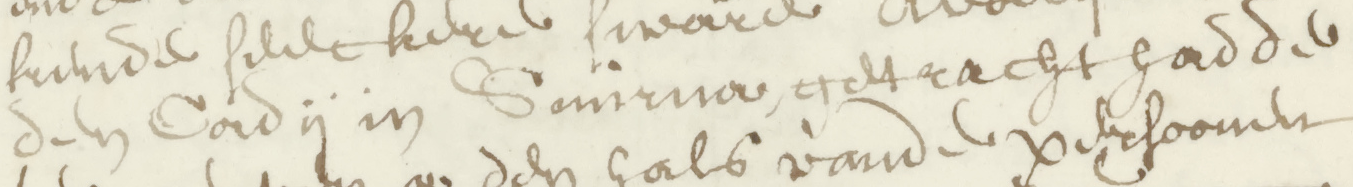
den Cadij in Smirna, getracht hadde
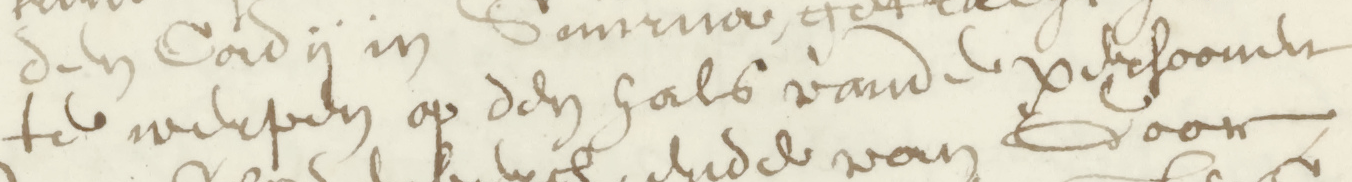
te werpen op den hals vande persoonen
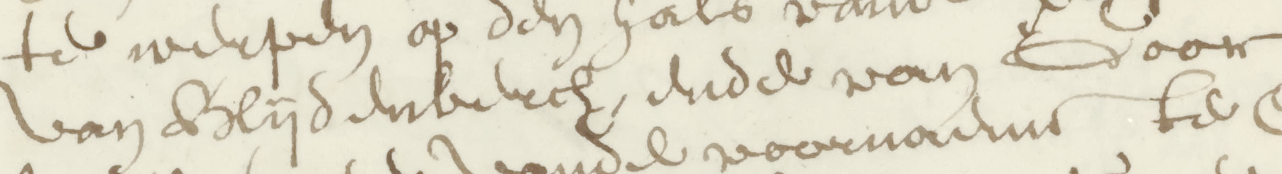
van Blijdenberch, ende van Goor
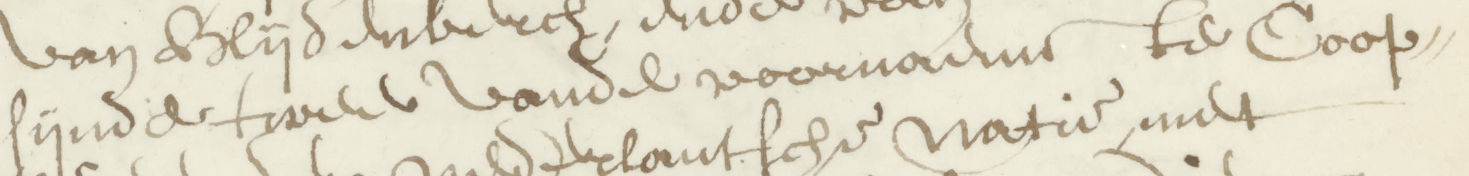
sijnde twee vande voornaemste Coop„
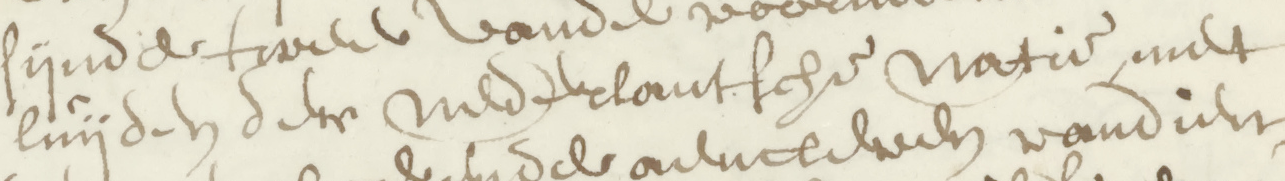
luijden der Nederlantsche natie, met
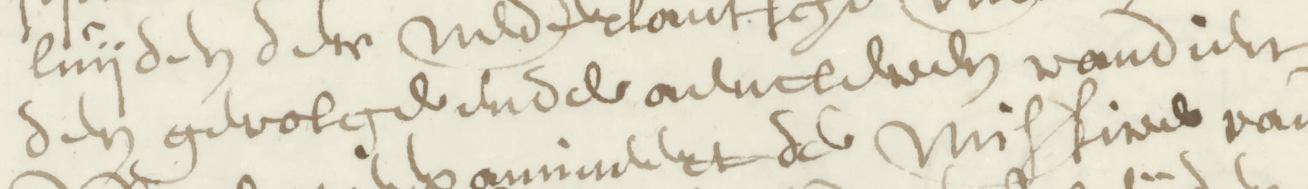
den gevolge ende aencleven vandien
